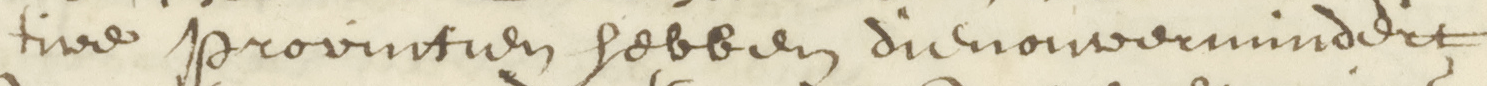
tive provintien hebben dienonvermindert
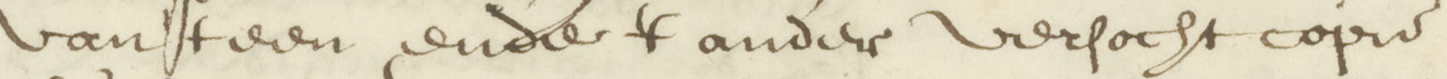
van't een ende 't ander versocht copie
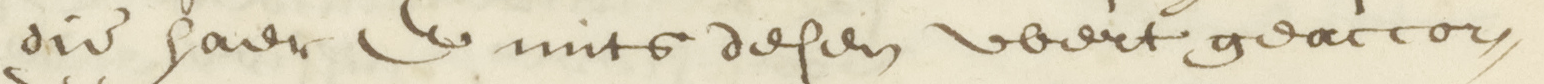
die haer E. mits desen wert geaccor„
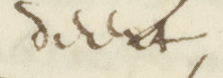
deert.
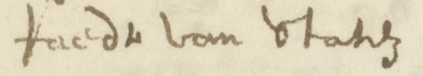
Raedt van Staten
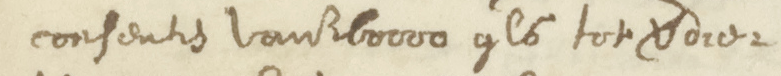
consenten van 60000 gls tot vdie„
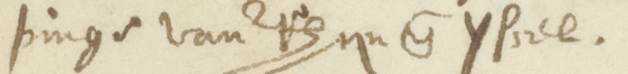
pinge van Rhijn & Yssel.
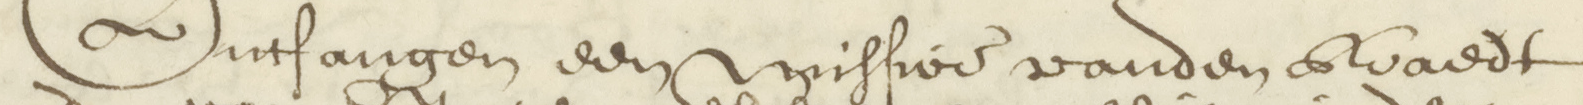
Ontfangen een missive vanden Raedt
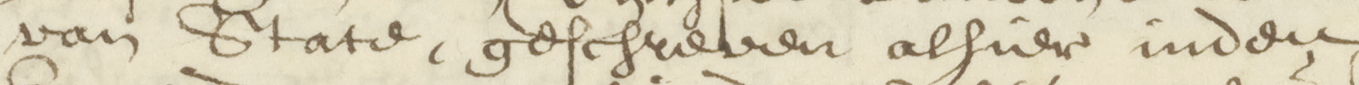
van State, geschreven alhier inden
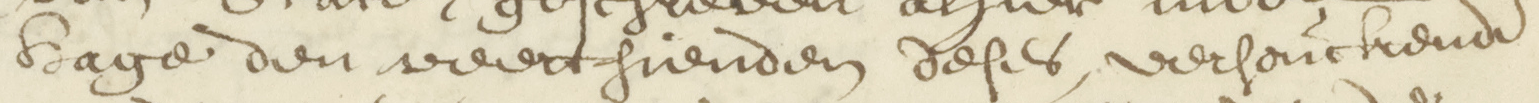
hage den veerthienden deses versouckende
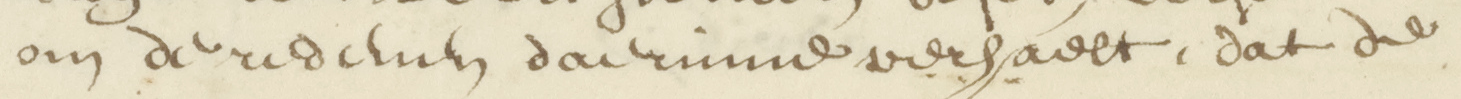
om de redenen daerinne verhaelt, dat de
